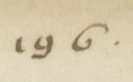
196.
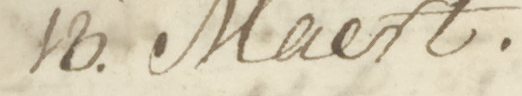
16. Maert.
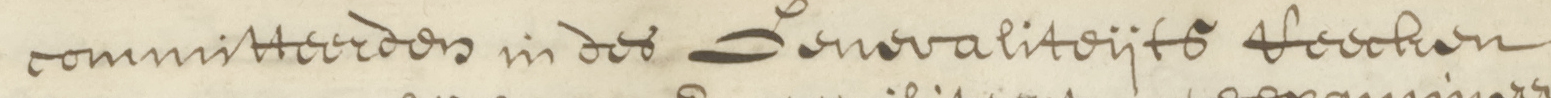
committeerden in des Generaliteijts Reecken„
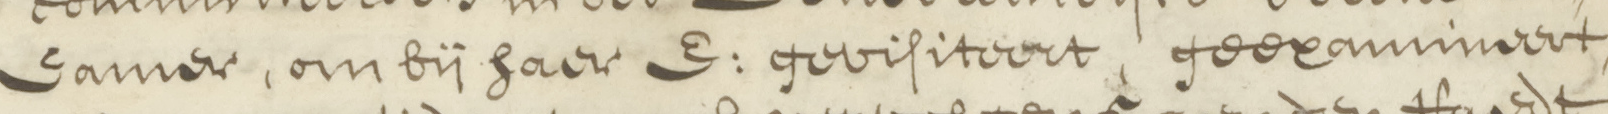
Camer, om bij haer E: gevisiteert, geexamineert,
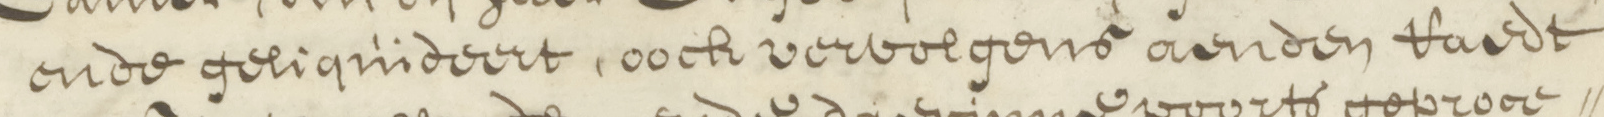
ende geliquideert, oock vervolgens aenden Raedt
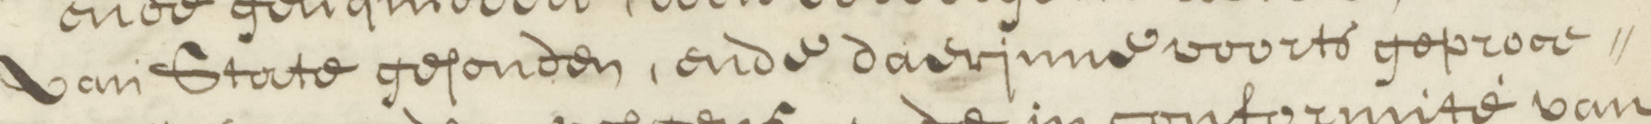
van State gesonden, ende daerinne voorts geproce„
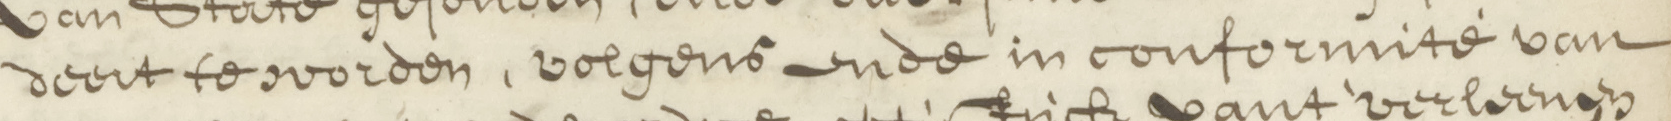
deert te worden, volgens ende in conformité van
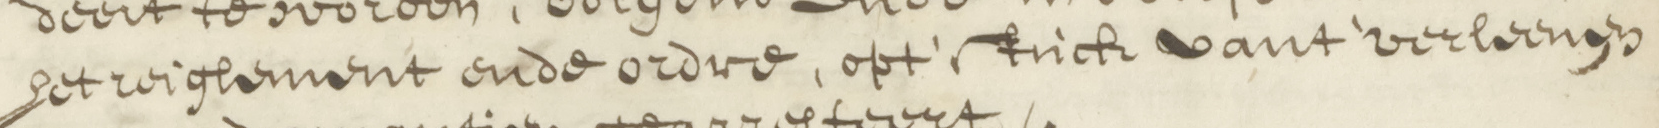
het reiglement ende ordre, opt‛ stuck vant‛ verleenen
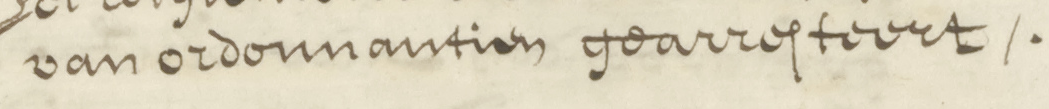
van ordonnantien gearresteert.
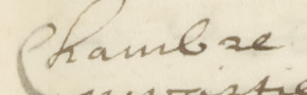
Chambre
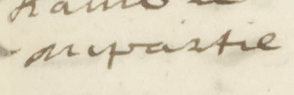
mipartie
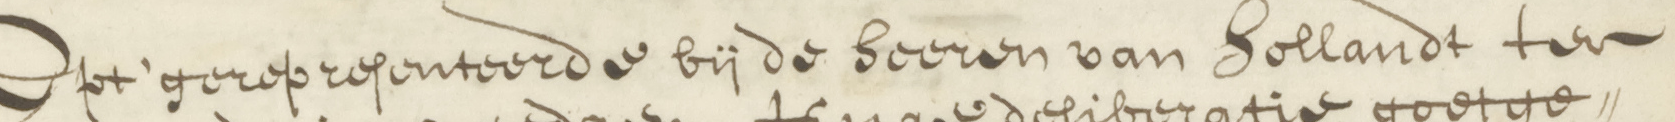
Opt‛ gerepresenteerde bij de heeren van Hollandt ter
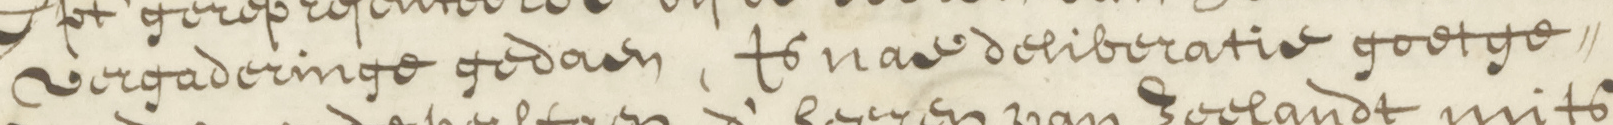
vergaderinge gedaen, Is nae deliberatie goetge„
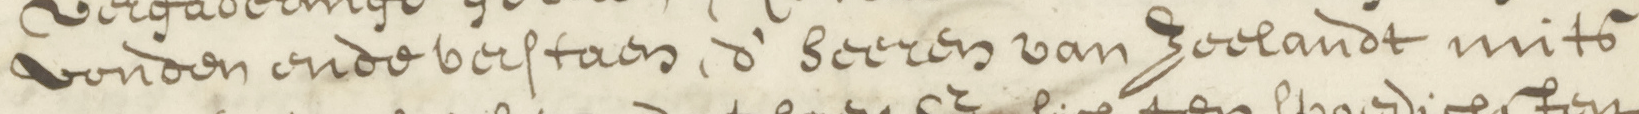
vonden ende verstaen, d‛ heeren van Zeelandt mits
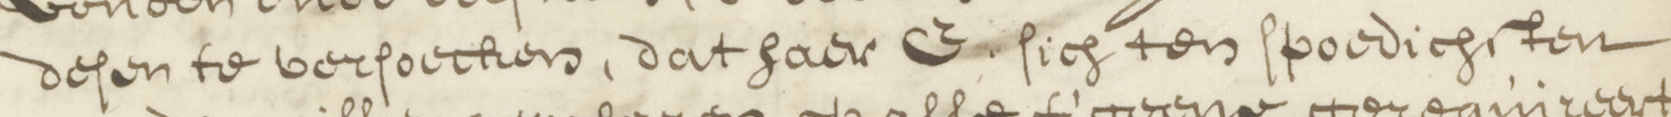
desen te versoecken, dat haer E. sich ten spoedichsten
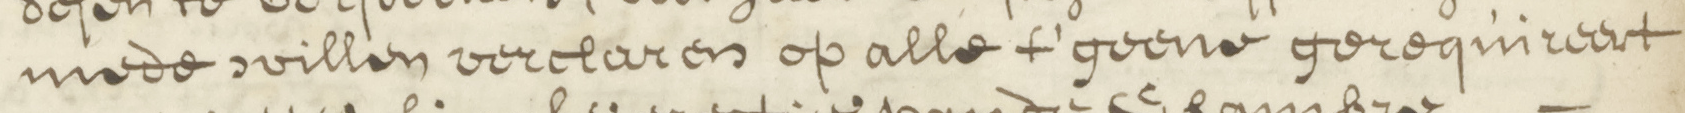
mede willen verclaren op alle t‛geene gerequireert
